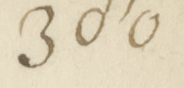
380
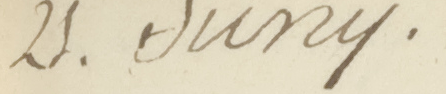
21. Junij.
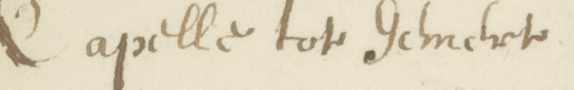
Capelle tot Gemert
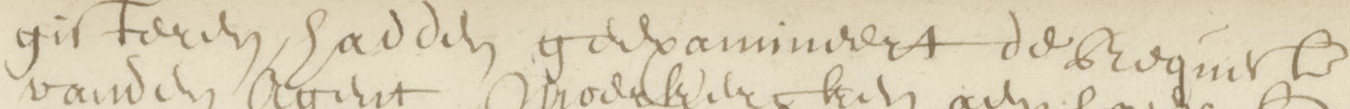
gisteren, hadden geexamineert de Requeste
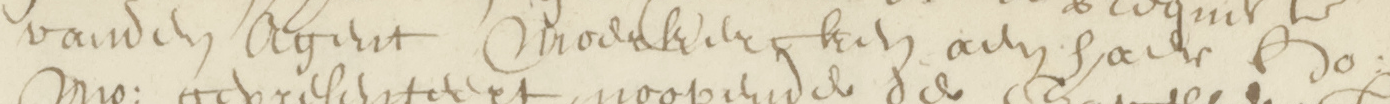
vanden Agent Moerkercken aen haer Ho:
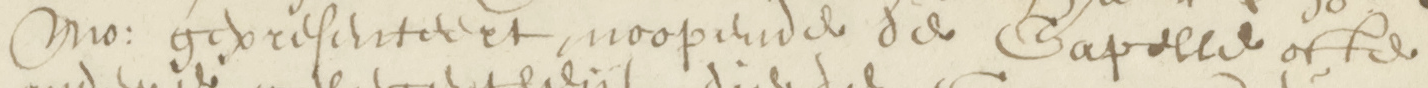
Mo: gepresenteert, noopende de Capelle ofte
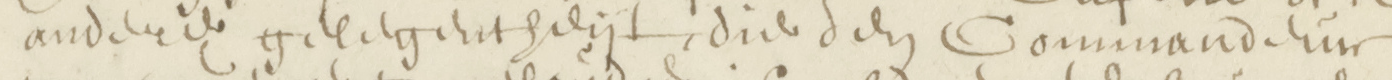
andere gelegentheijt, die den Commandeur
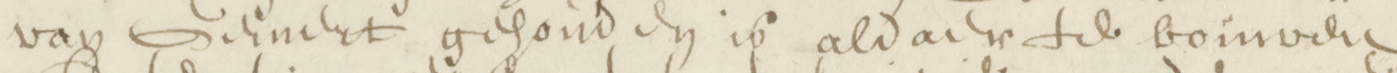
van Gemert ghouden is aldaer te bouwen,
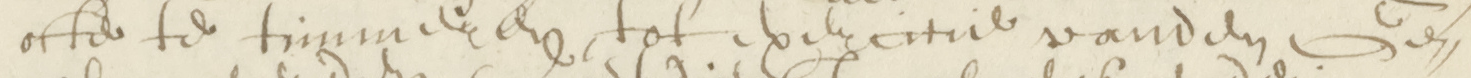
ofte te timmeren, tot exercitie vanden Ge,,
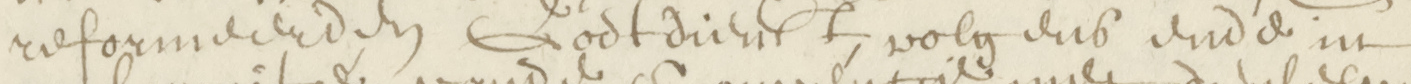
reformeerden Godtdienst, volgens ende in
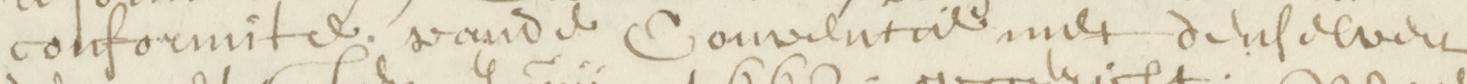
conformité van de Conventie met denselven
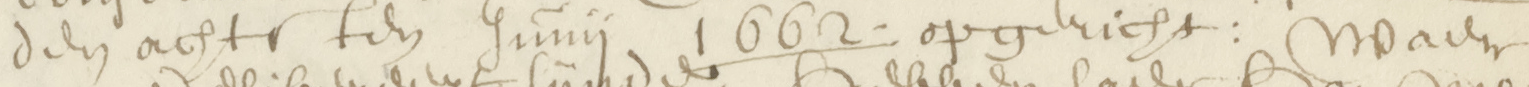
den achtsten Junij 1662 opgericht: Waer
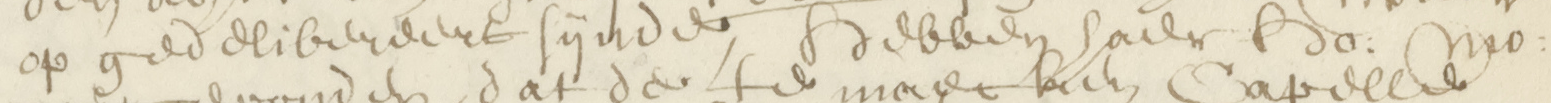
op gedelibereert sijnde, Hebben haer Ho:Mo:
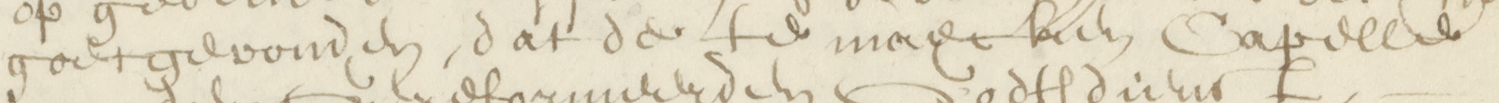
goetgevonden, dat de te maecken Capelle
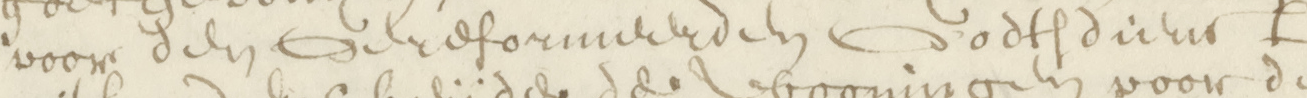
voor den Gereformeerden Godtsdienst, —
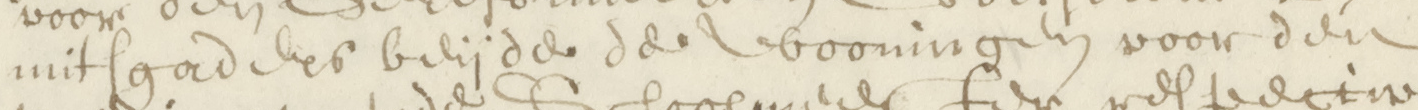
mitsgaders beijde de Wooningen voor den
